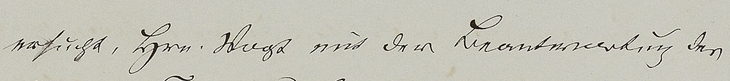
ersucht, Hrn. Vogt mit der Beantwortung der
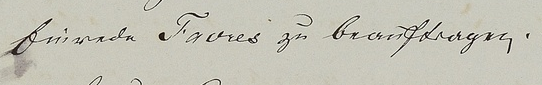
Einrede Favres zu beauftragen. –
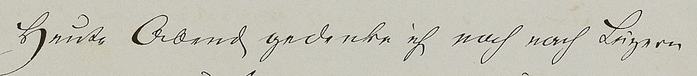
Heute Abend gedenke ich noch nach Luzern
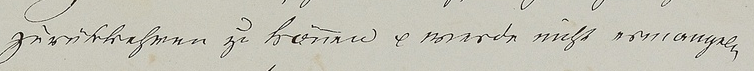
zurükkehren zu können & werde nicht ermangeln
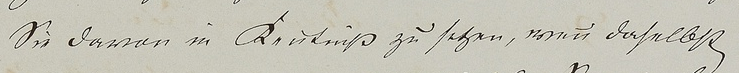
Sie davon in Kenntniß zu setzen, wenn daselbst
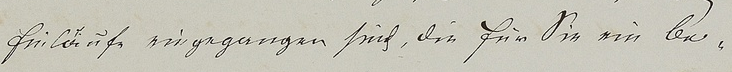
Einläufe eingegangen sind, die für Sie ein be-
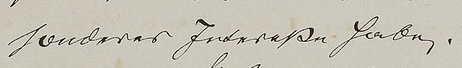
sonderes Intereße haben.
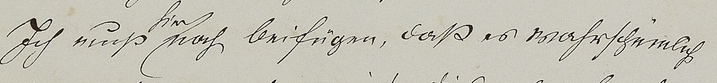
Ich muß hier noch beifügen, daß es wahrscheinlich
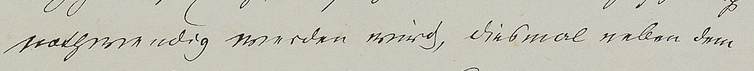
nothwendig werden wird, diesmal neben dem
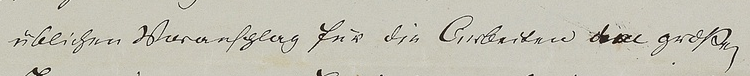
üblichen Voranschlag für die Arbeiten am großen
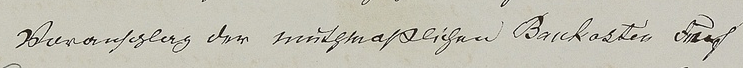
Voranschlag der muthmaßlichen Baukosten auf
